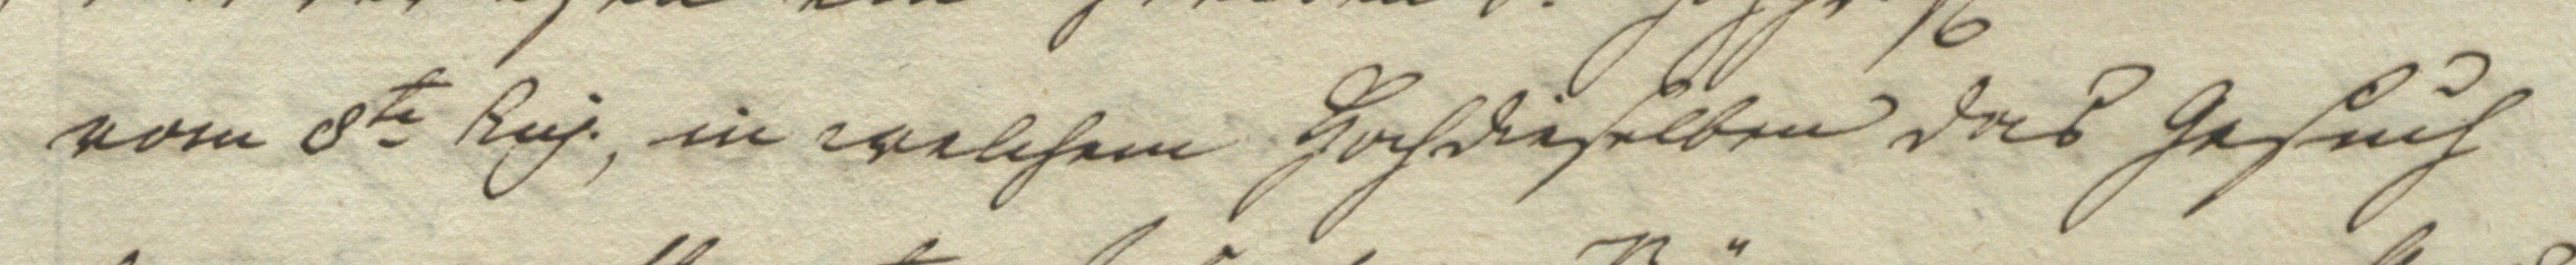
vom 8 t huj., in welchem Hochdieselben das Gesuch
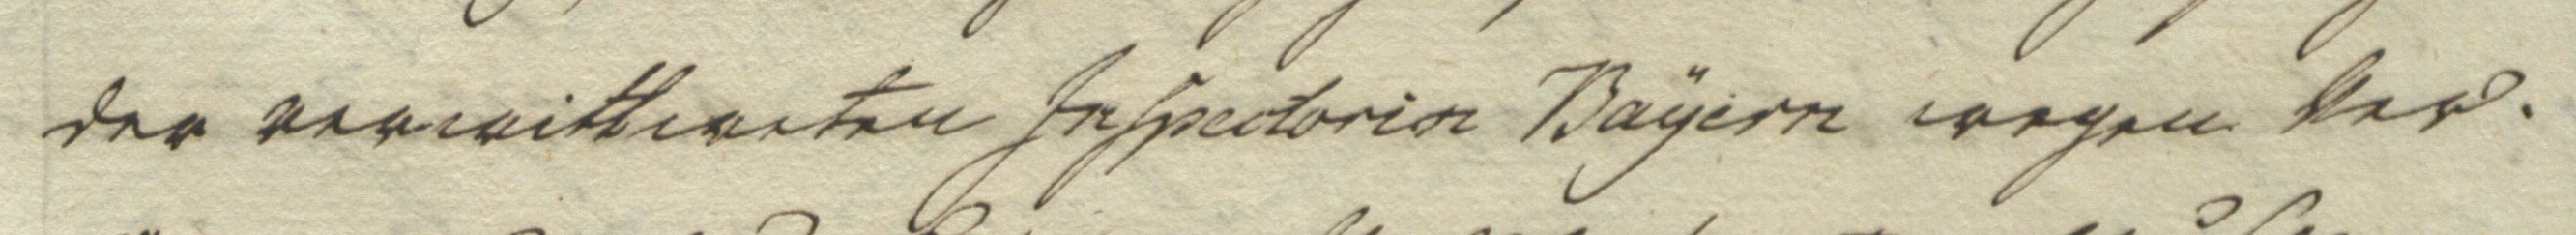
der verwittweten Inspectori Baÿern wegen Ver¬
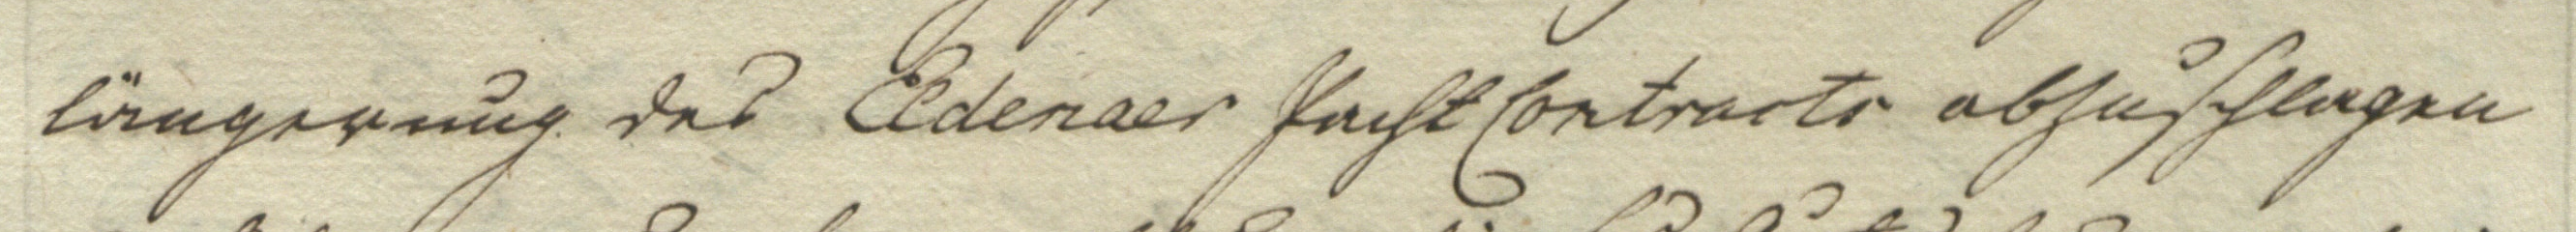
längerung des Eldenaer Pacht Contracts abzuschlagen
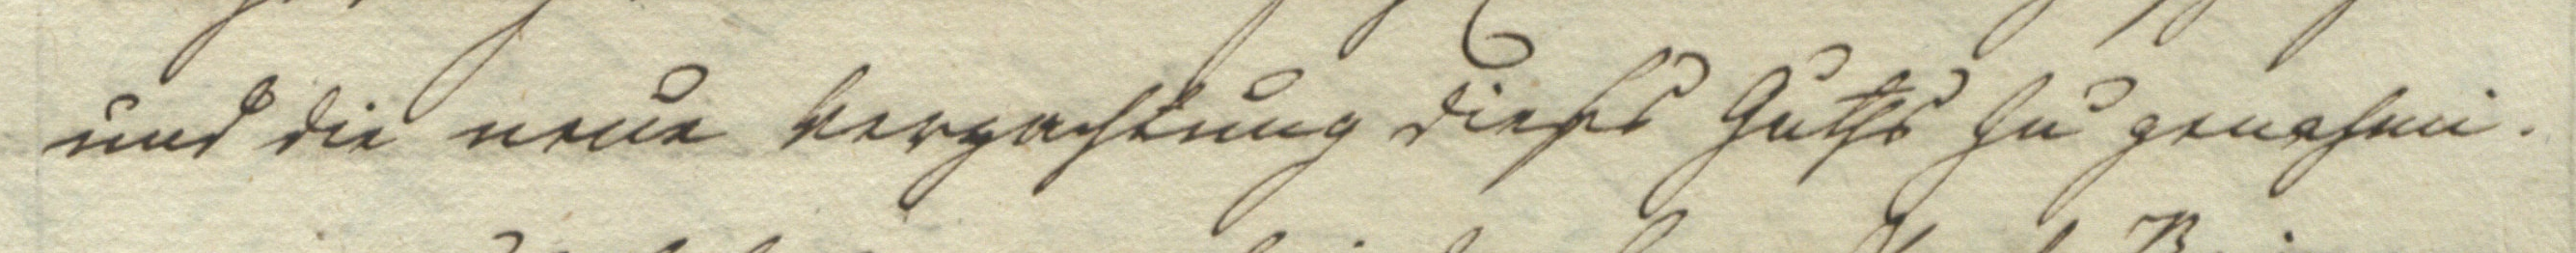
und die neue Verpachtung dieses Guths zu genehmi¬
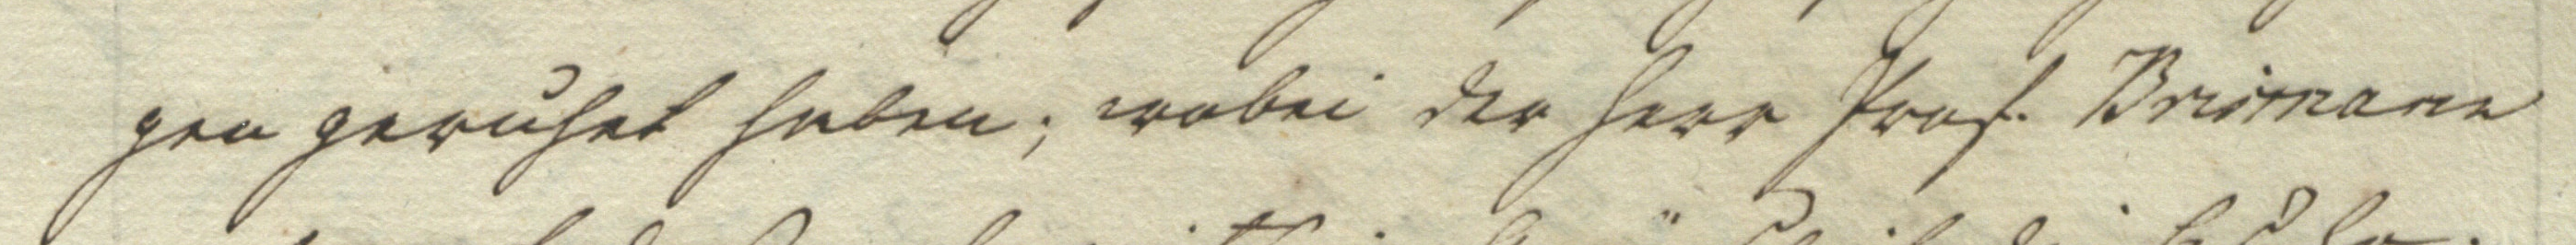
gen geruhet haben; wobei der Herr Prof. Brismann
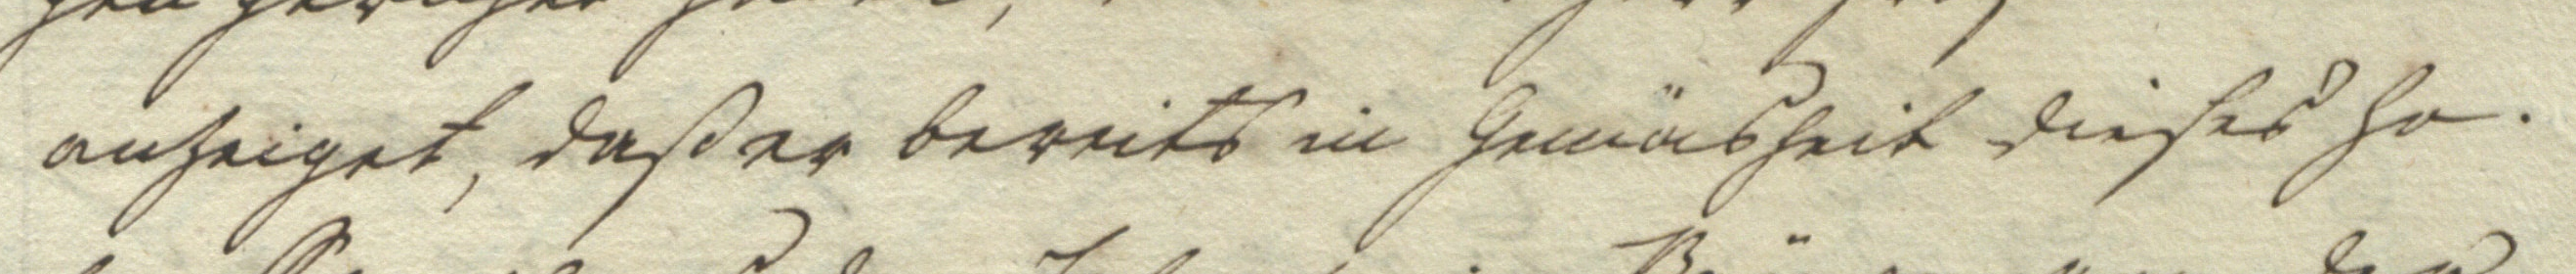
anzeiget, daß er bereits in Gemäsheit dieses ho¬
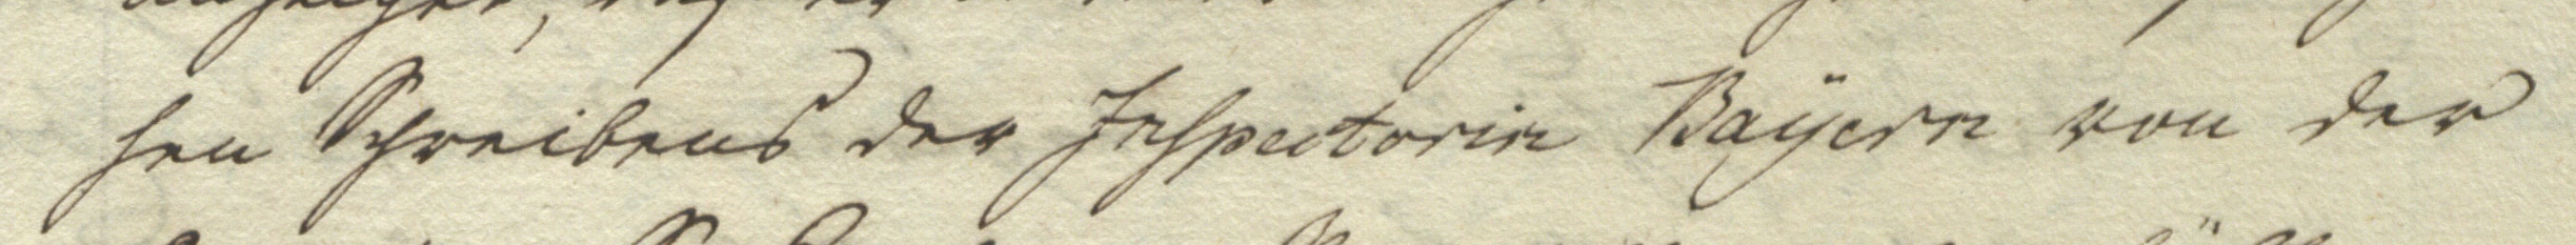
hen Schreibens der Inspectorin Baÿern von der
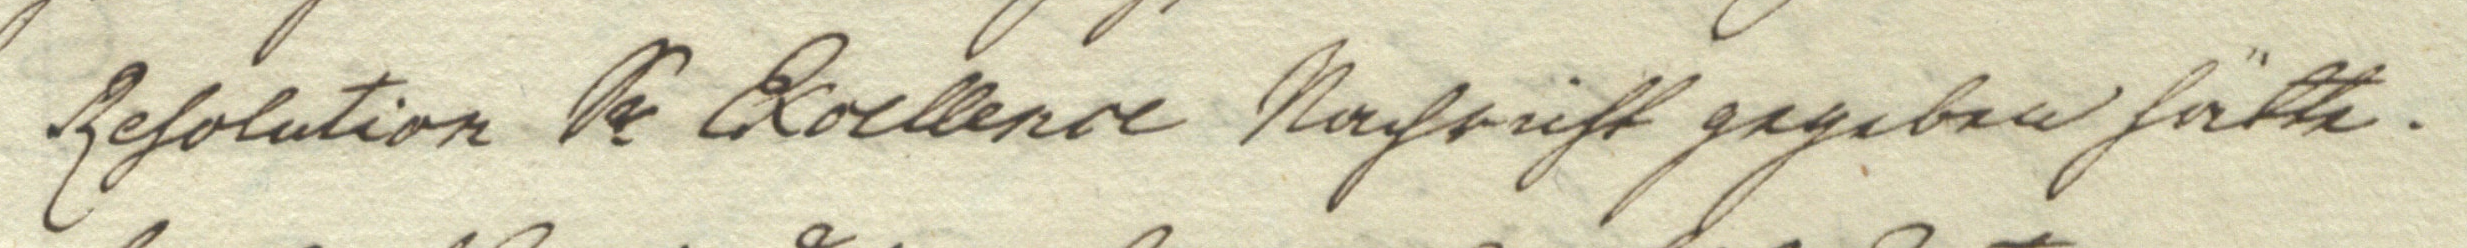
Resolution Sr Excellence Nachricht gegeben hätte.
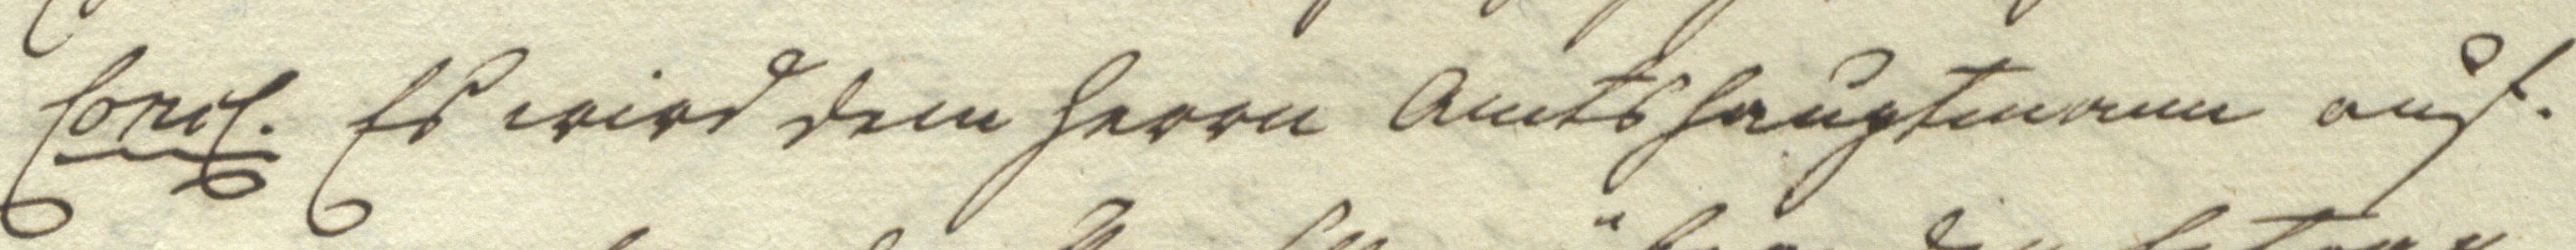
Concl. Es wird dem Herrn Amtshauptmann auf¬
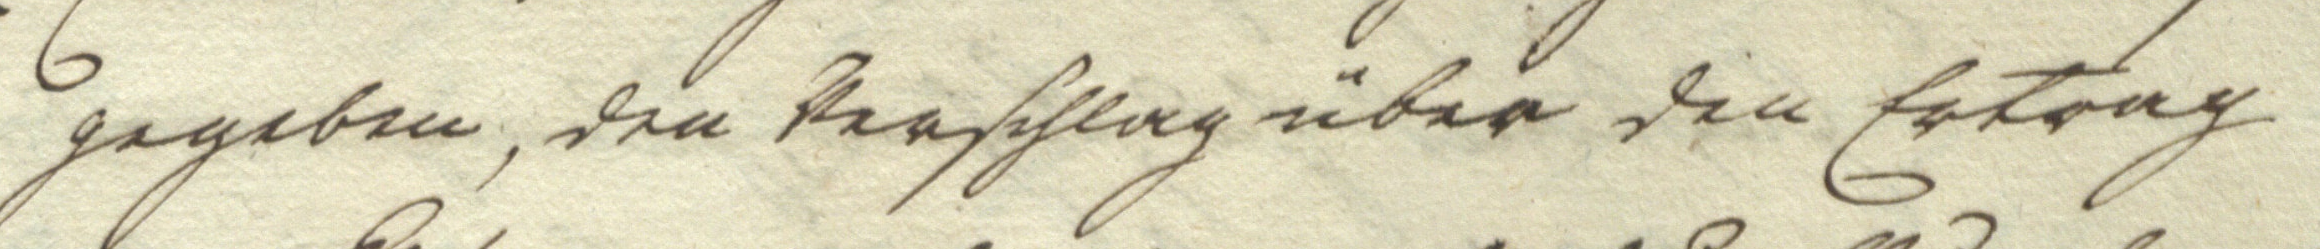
gegeben, den Verschlag über den Ertrag
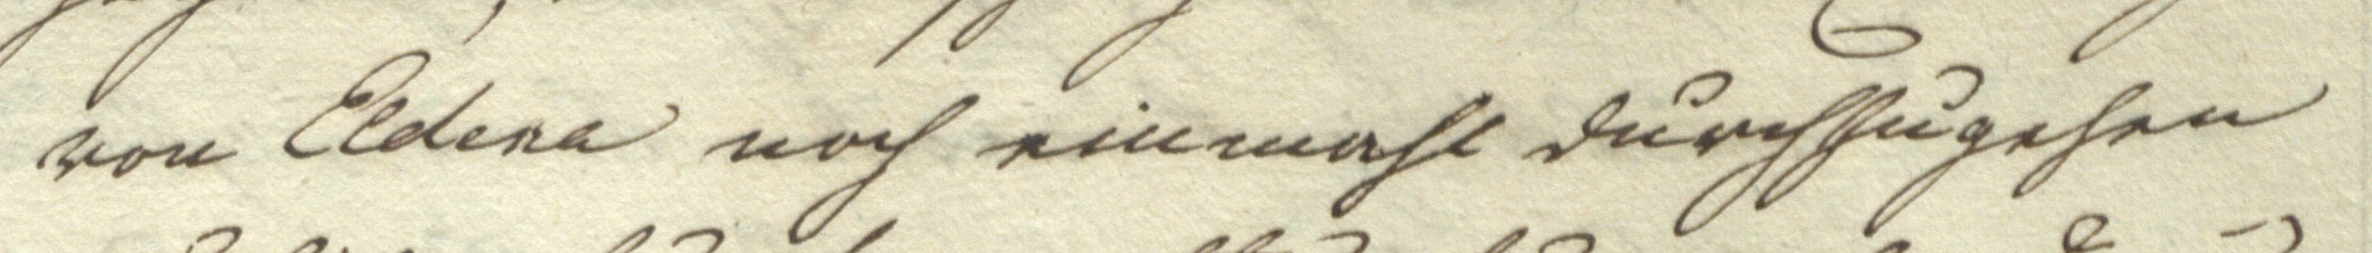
von Eldena noch einmahl durchzugehen
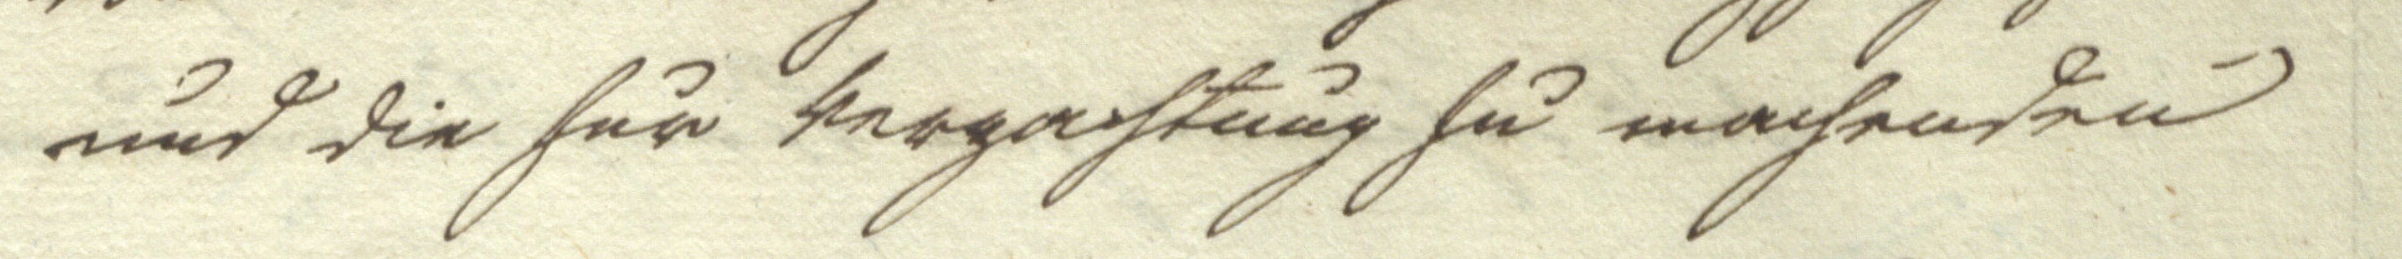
und die zur Verpachtung zu machenden
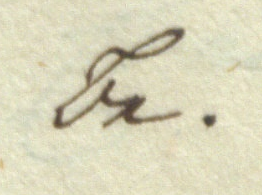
Be.
